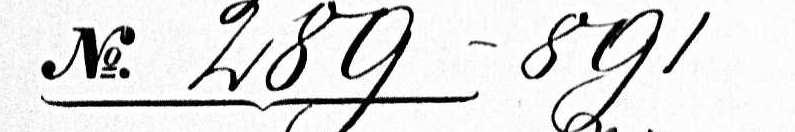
No. 289 – 1891
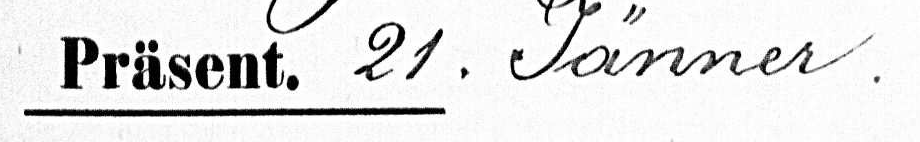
Präsent. 21 Jänner
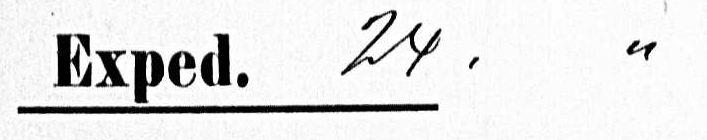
Expedit 24. Jänner
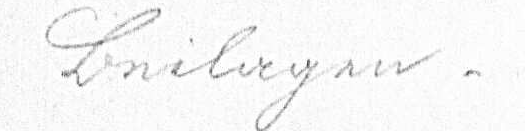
Beilagen
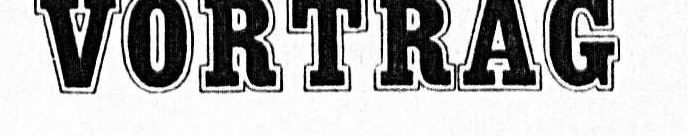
VORTRAG
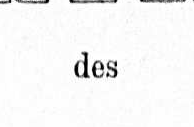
des
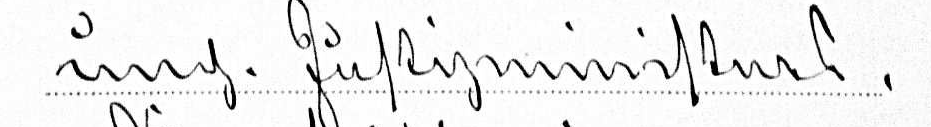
ung. Justizministers
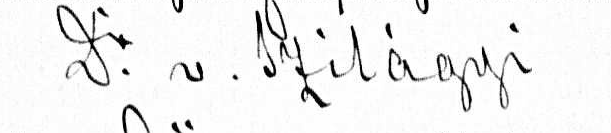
D. v. Szitágyi
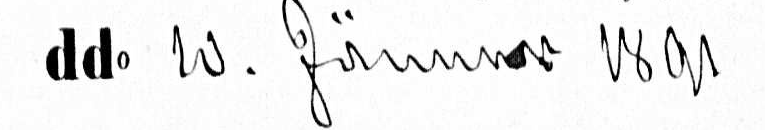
Ddo 20 Jänner 1891
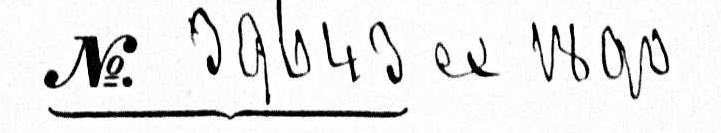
No 39643 ex 1890
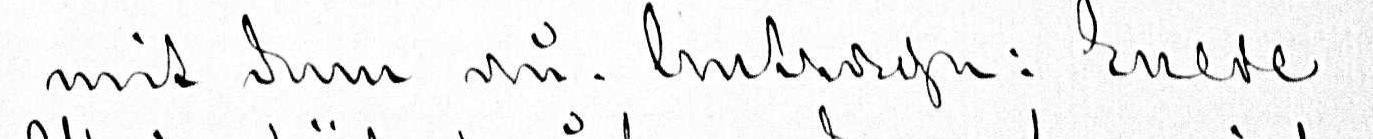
Mit dem au. Antrage: Euere
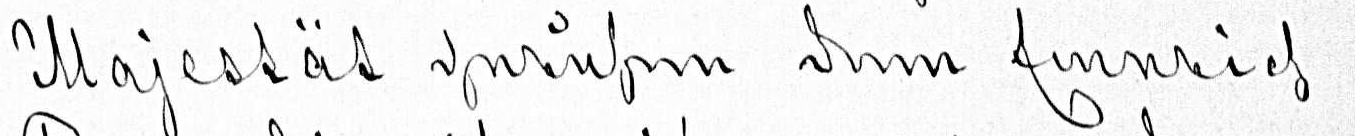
Majestät geruhen dem Emerich
